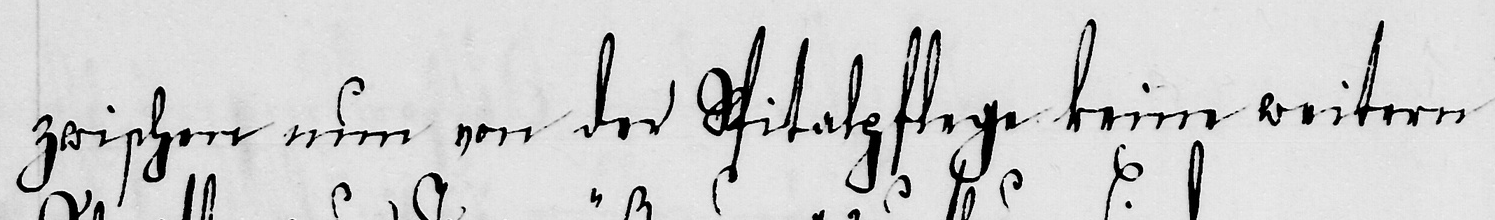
zwischen nun von der Spitalpflege keine weitern
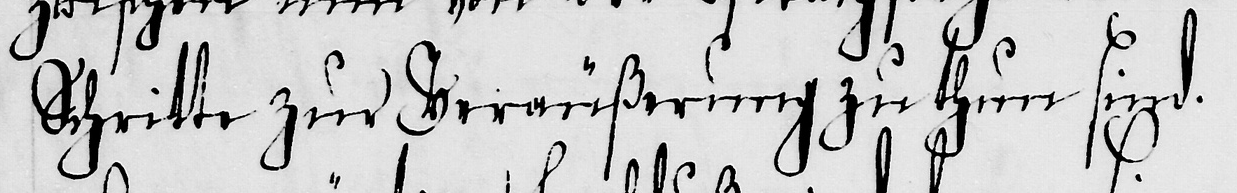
Schritte zur Veräußerung zu thun sind.
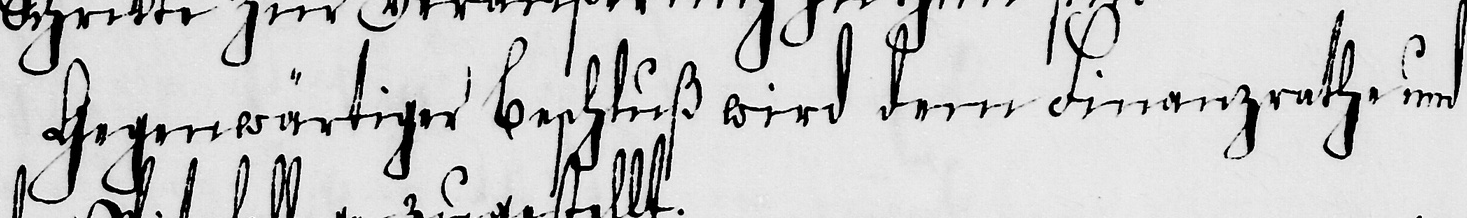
Gegenwärtiger Beschluß wird dem Finanzrathe und
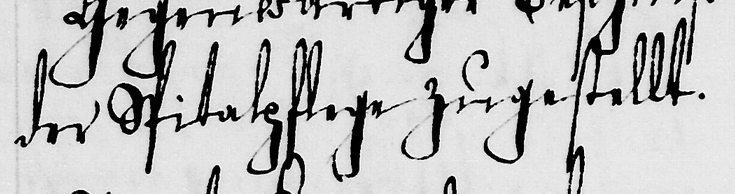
der Spitalpflege zugestellt.
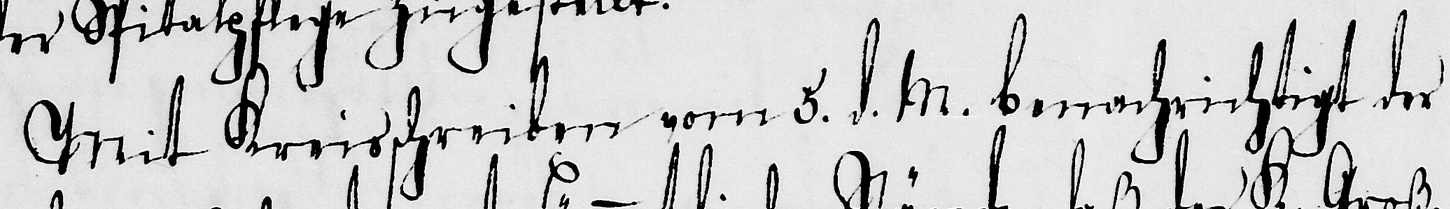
Mit Kreisschreiben vom 5. d. M. benachrichtigt der
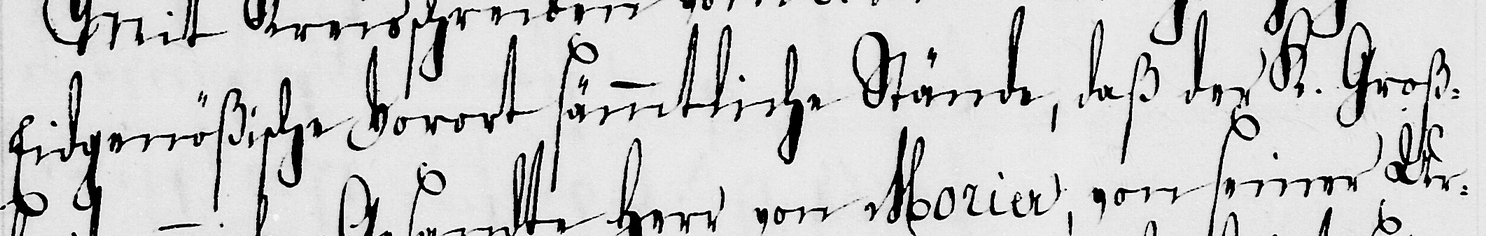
Eidgenößische Vorort sämmtliche Stände, daß der K. Groß¬
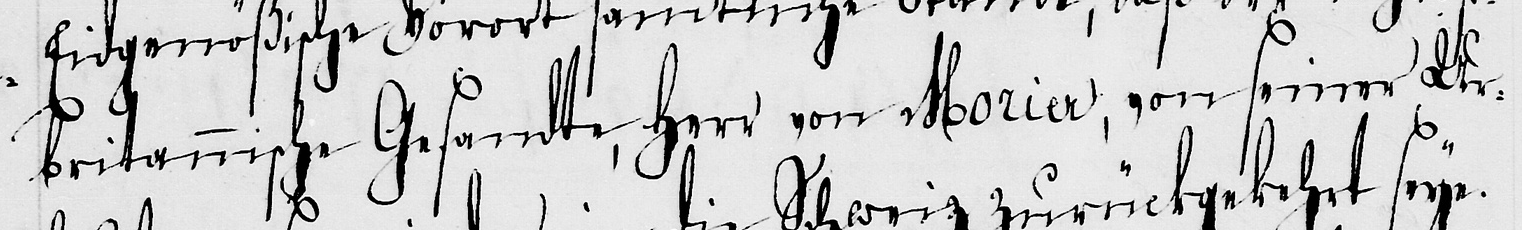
britannische Gesandte, Herr von Morier, von seiner Ur¬
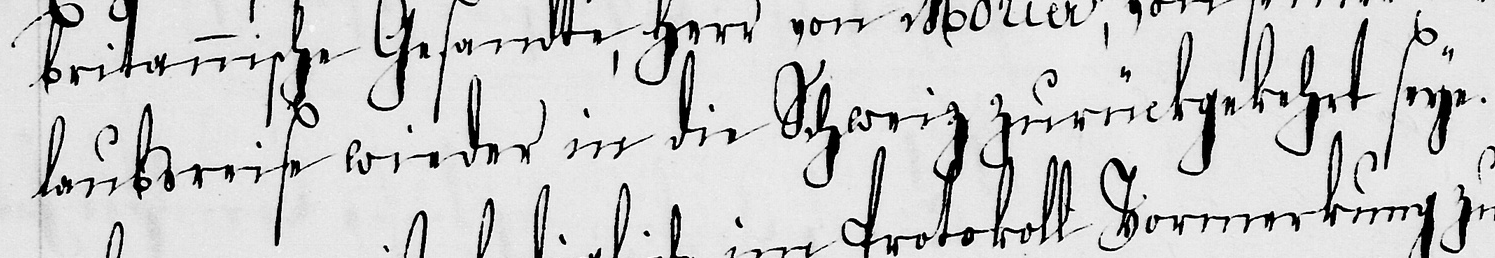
laubsreise wieder in die Schweiz zurückgekehrt seye.
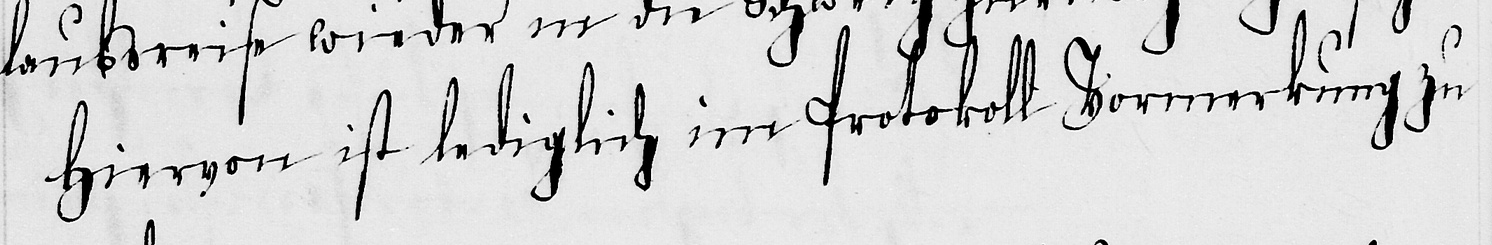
Hiervon ist lediglich im Protokoll Vormerkung zu
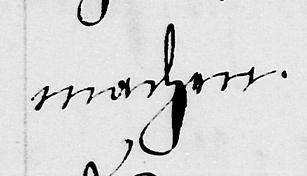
machen.
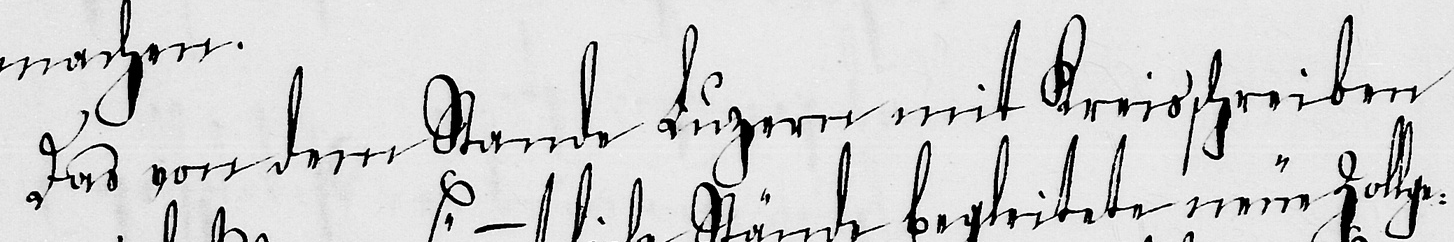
Das von dem Stande Luzern mit Kreisschreiben
